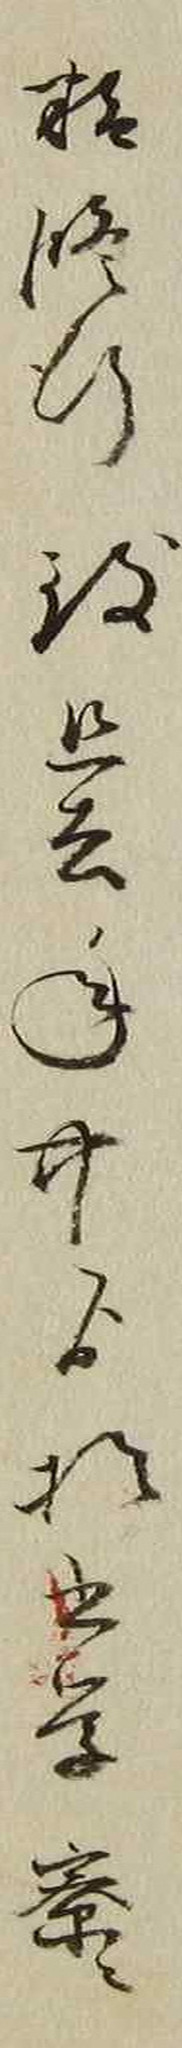精修行致且去年中ゟ於書学寮ニ
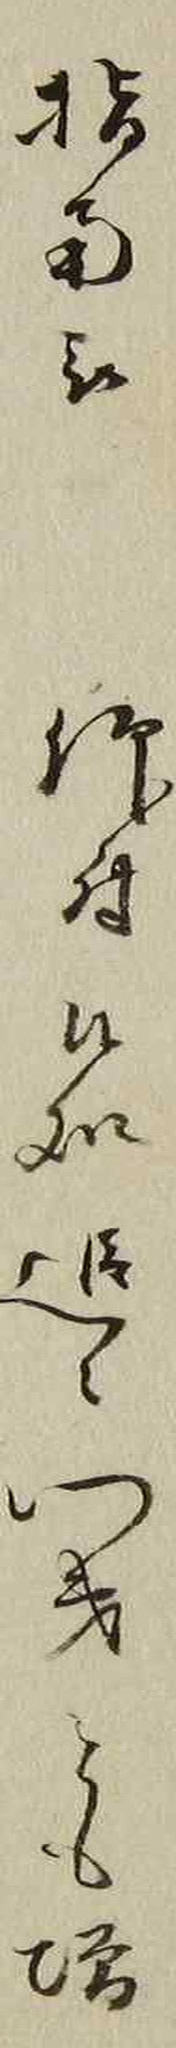指南被仰付候処追々門弟とも増
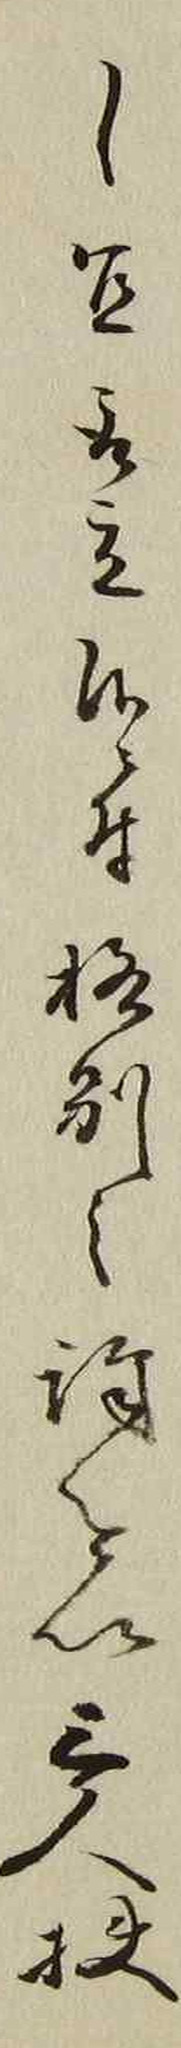し宜取立候ニ付格別之訳を以三人扶
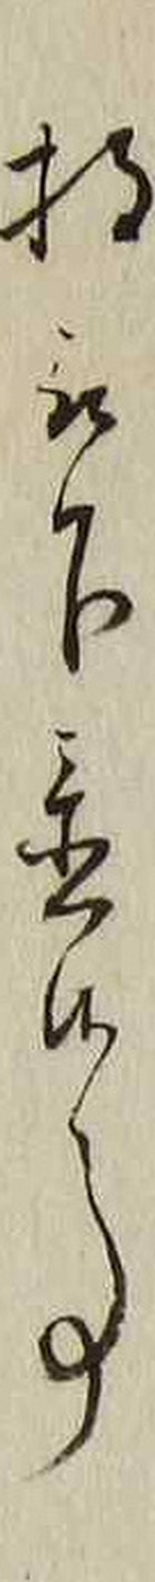持被下置候事
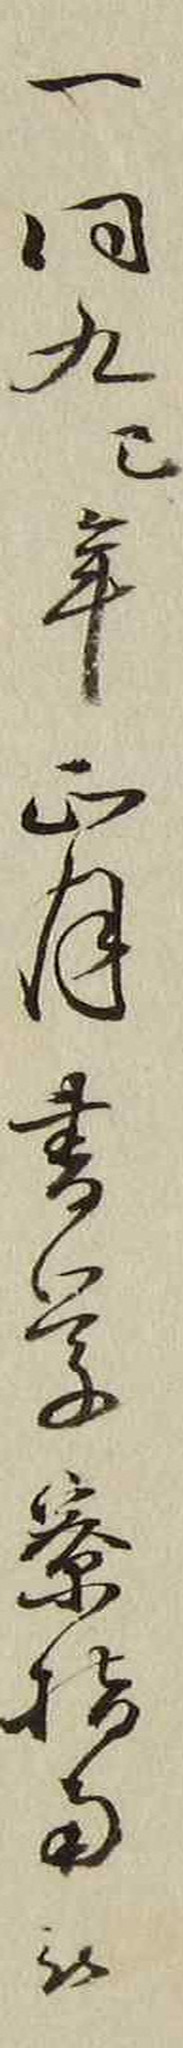一同九巳年正月書学寮指南被
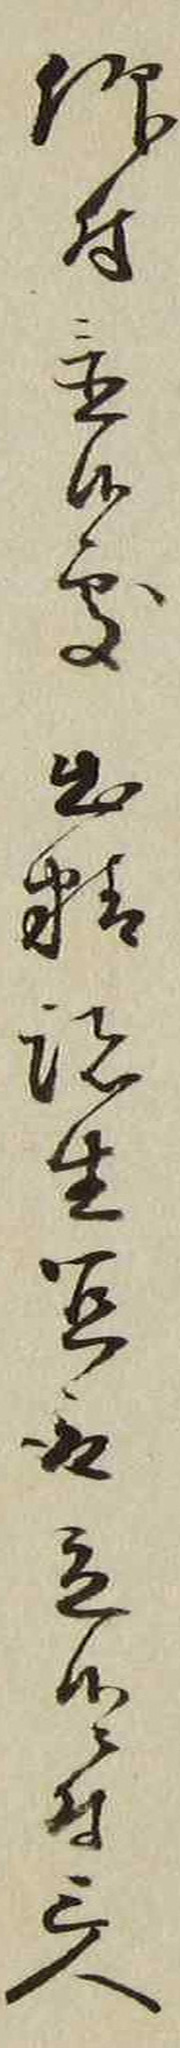仰付置候処出精諸生宜取立候ニ付三人
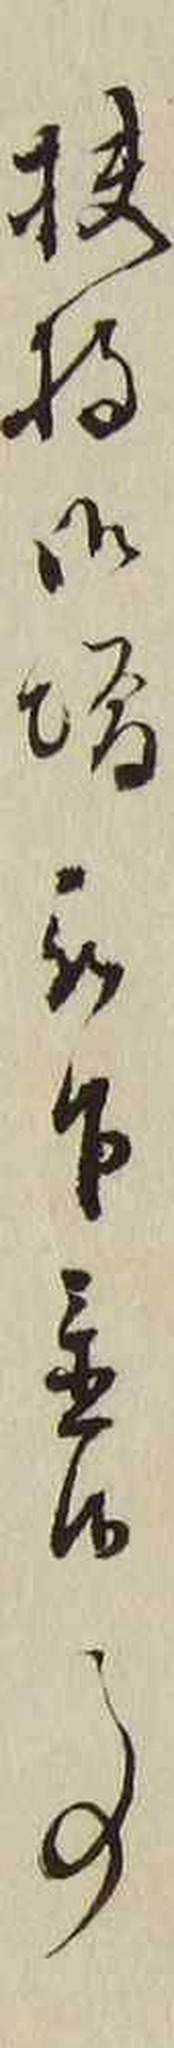扶持御増被下置候事

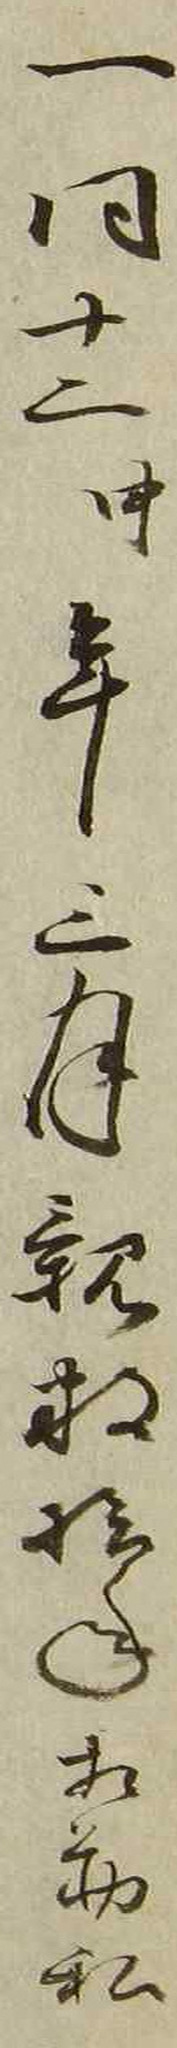一同十二申年三月親数拾年相勤私
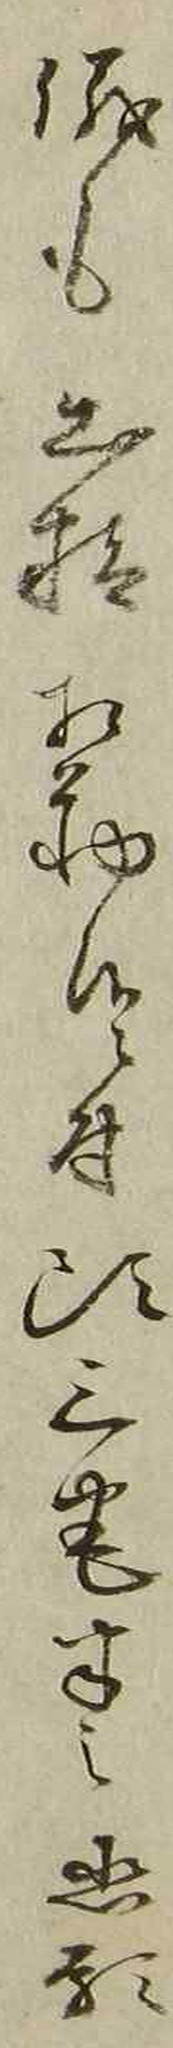儀も出精相勤候ニ付頭三宅半之丞願
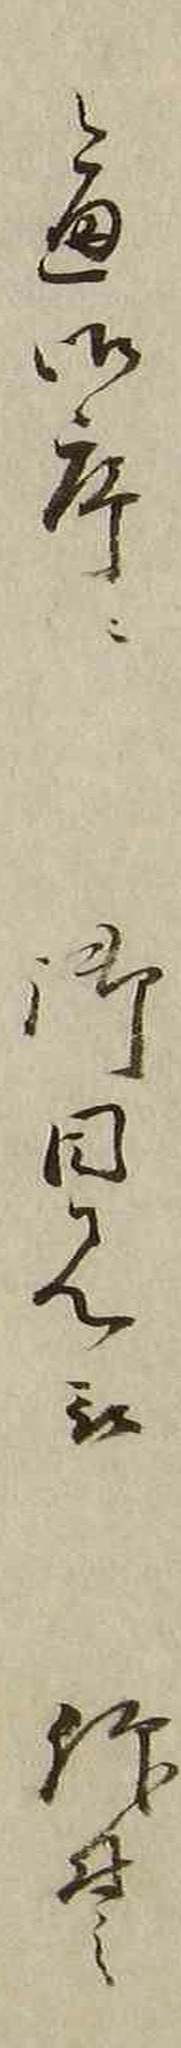之通御序ニ御目見被仰付之
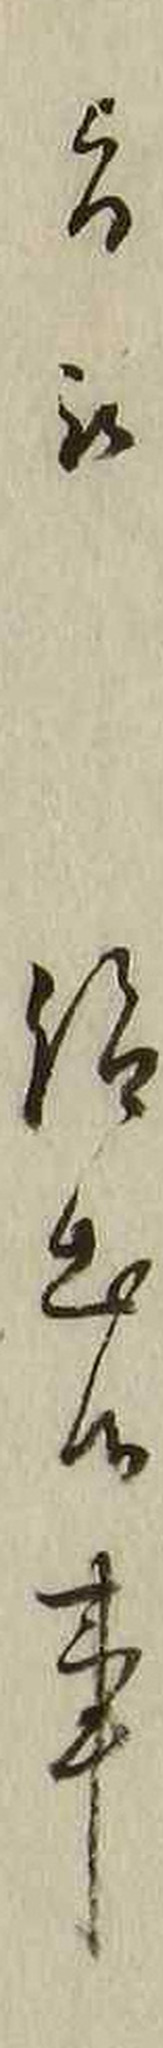旨被仰出候事
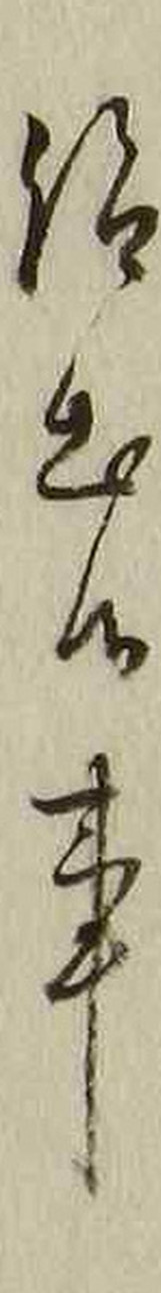仰付候事
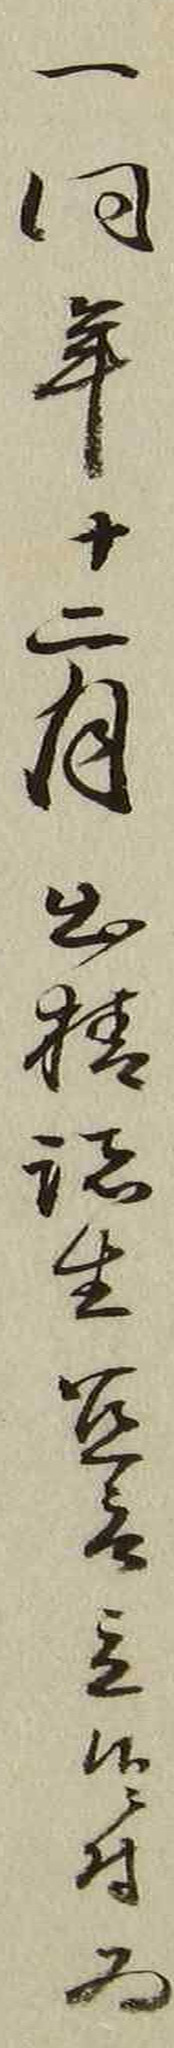一同年十二月出精諸生宜取立候ニ付為
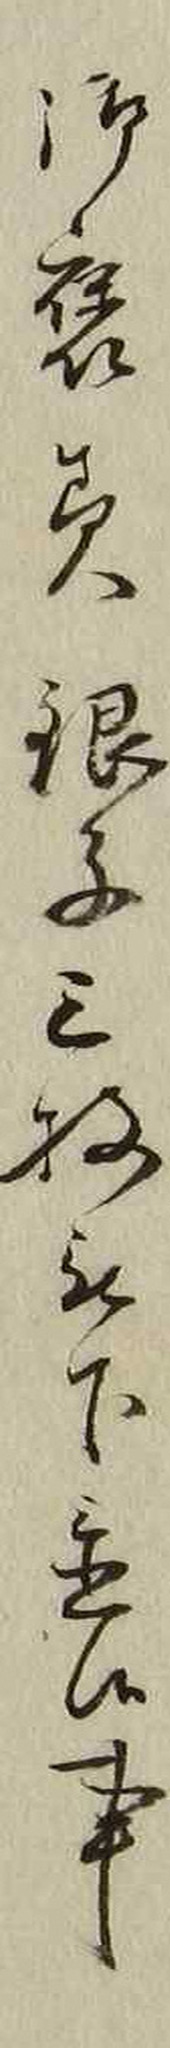御褒美銀子三枚被下置候事
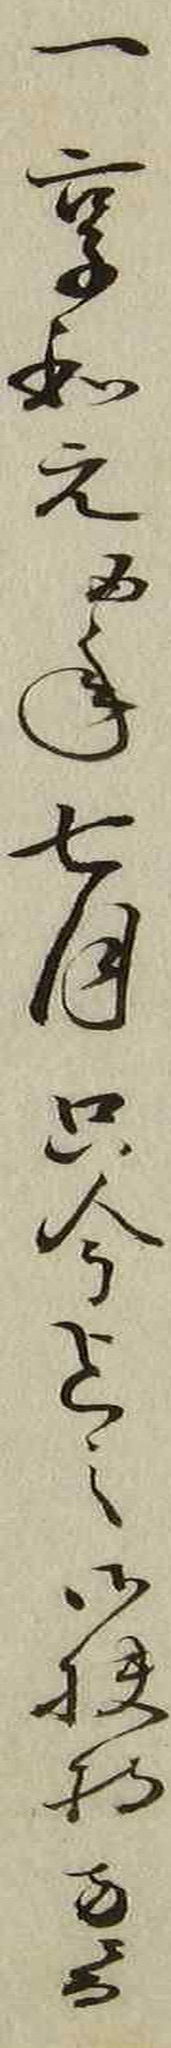一享和元酉年七月只今迄之御扶持方ニ而
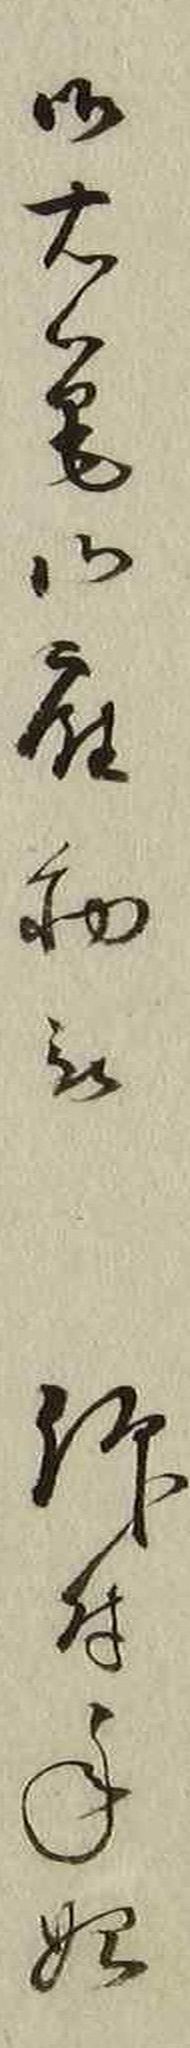御右筆御雇勤被仰付年始
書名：諸士系譜　巻之4　い之部4
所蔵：会津若松市立会津図書館
